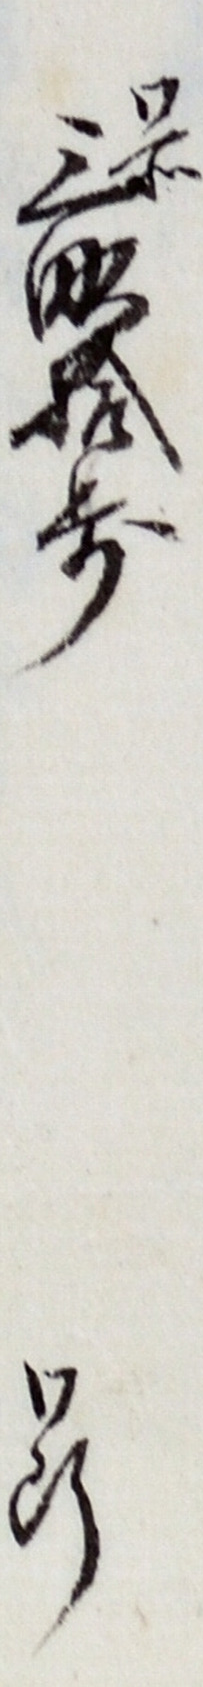三畝拾歩同断
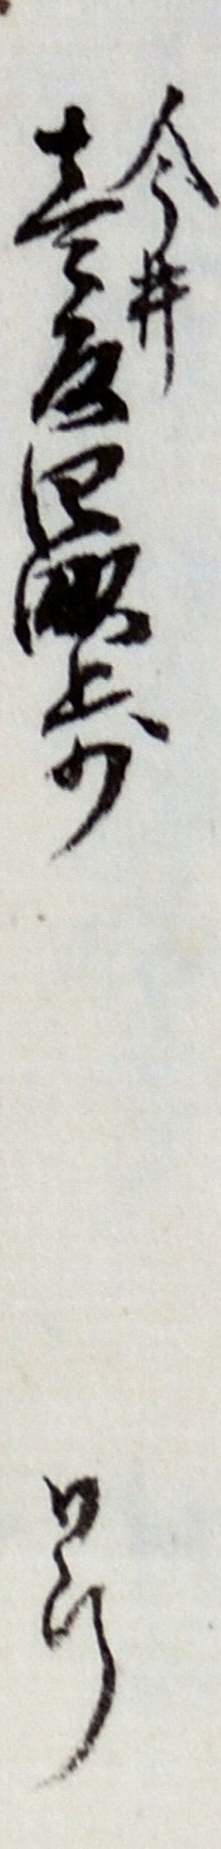壱反四畝歩同断
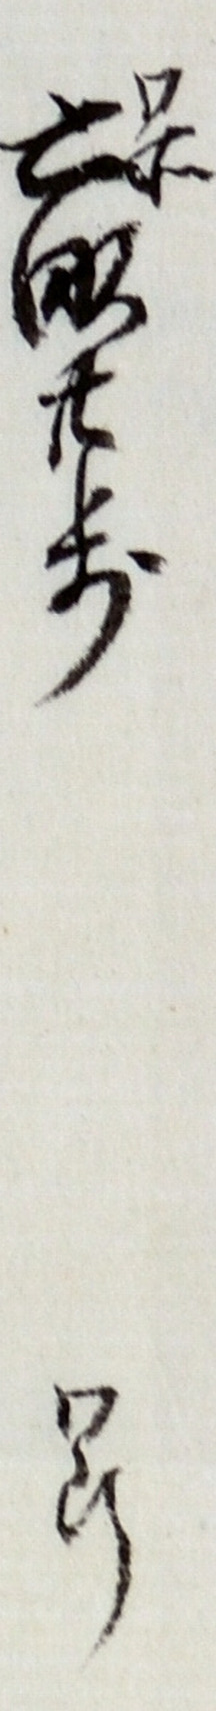六畝廿歩同断
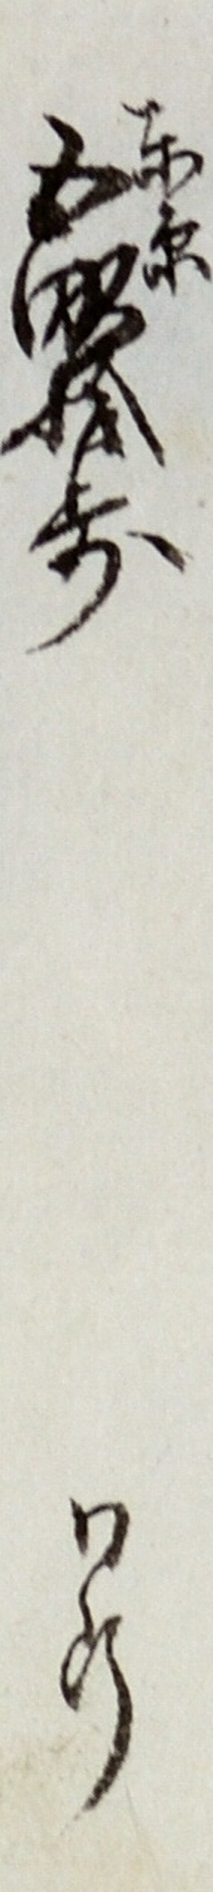五畝拾歩同断
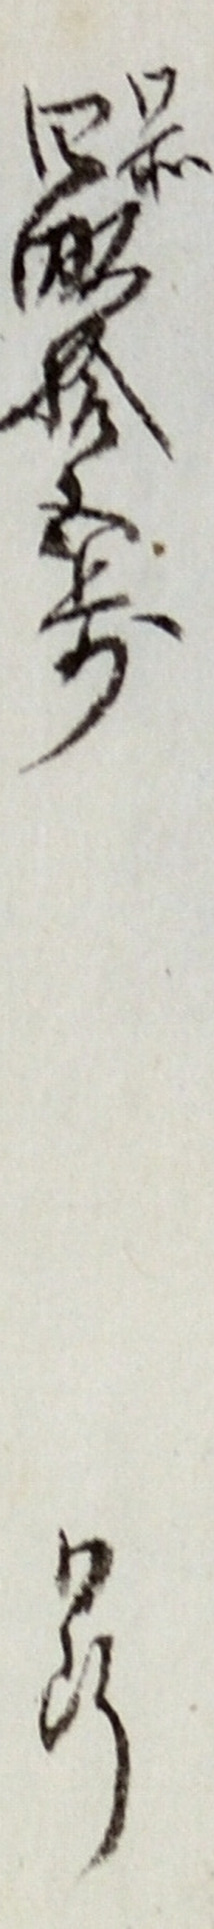四畝拾五歩同断
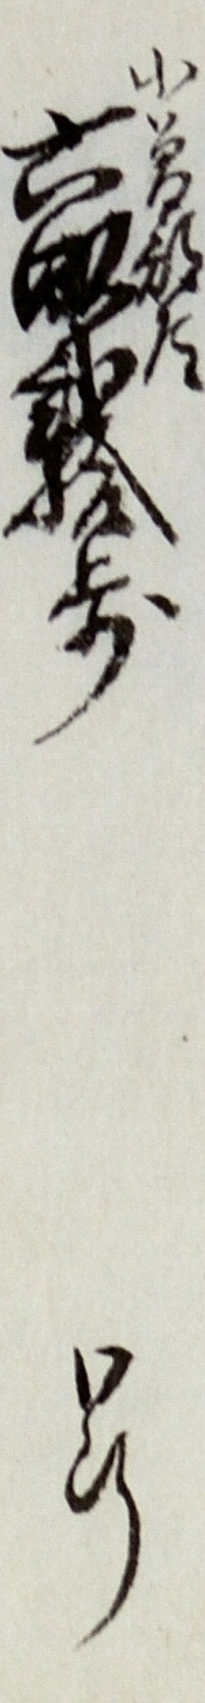六畝弐拾歩同断
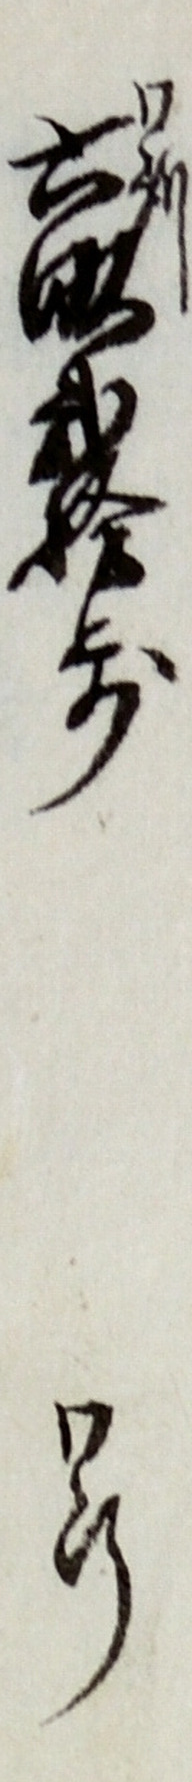六畝弐拾歩同断
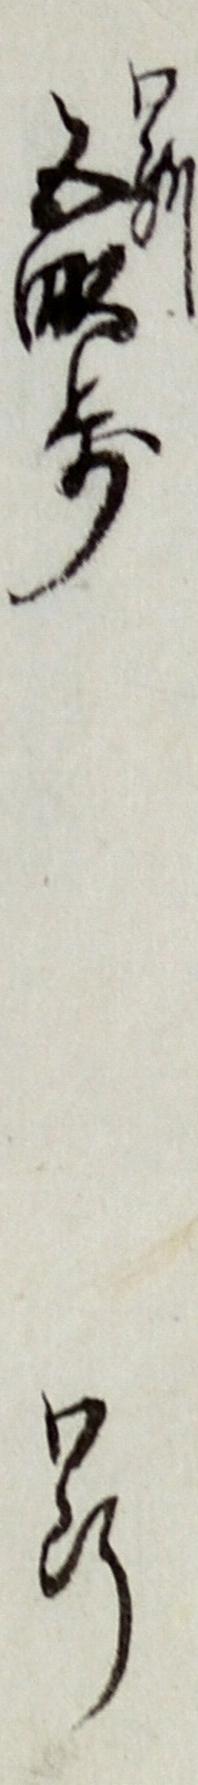五畝歩同断

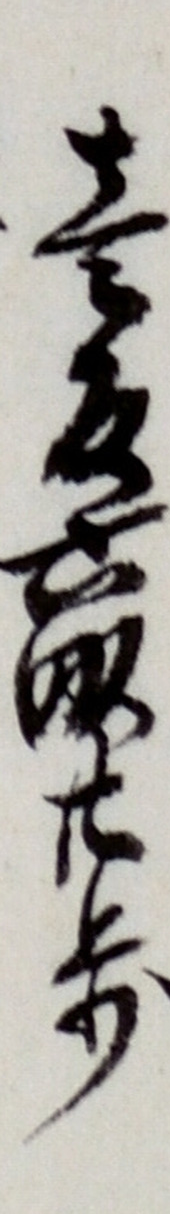壱反六畝廿歩同断
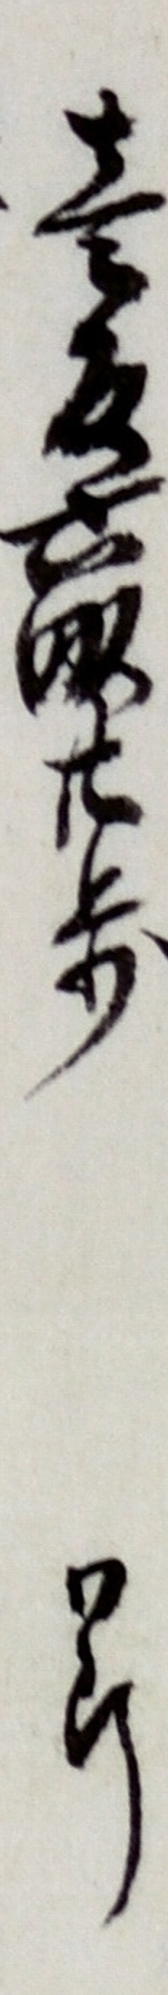壱反六畝廿歩同断
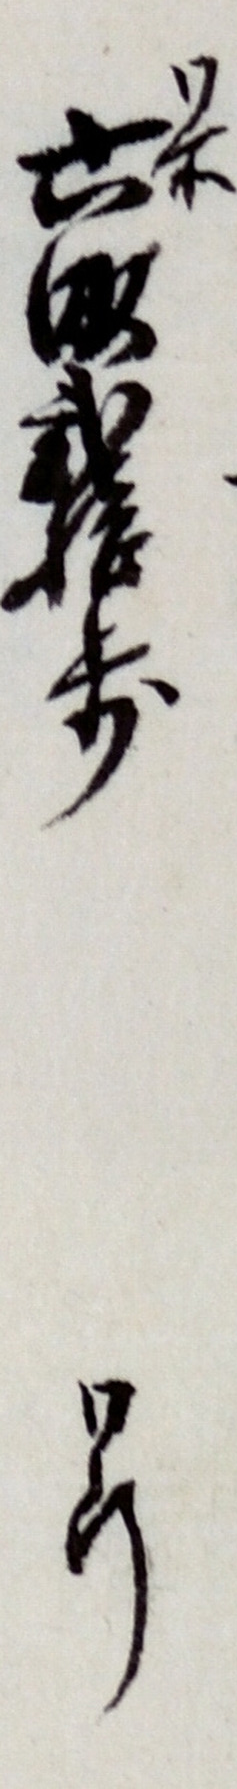六畝弐拾歩同断
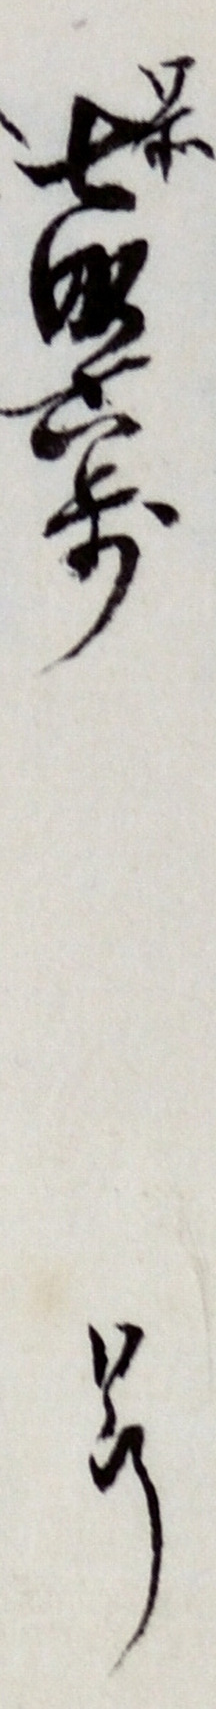七畝六歩同断
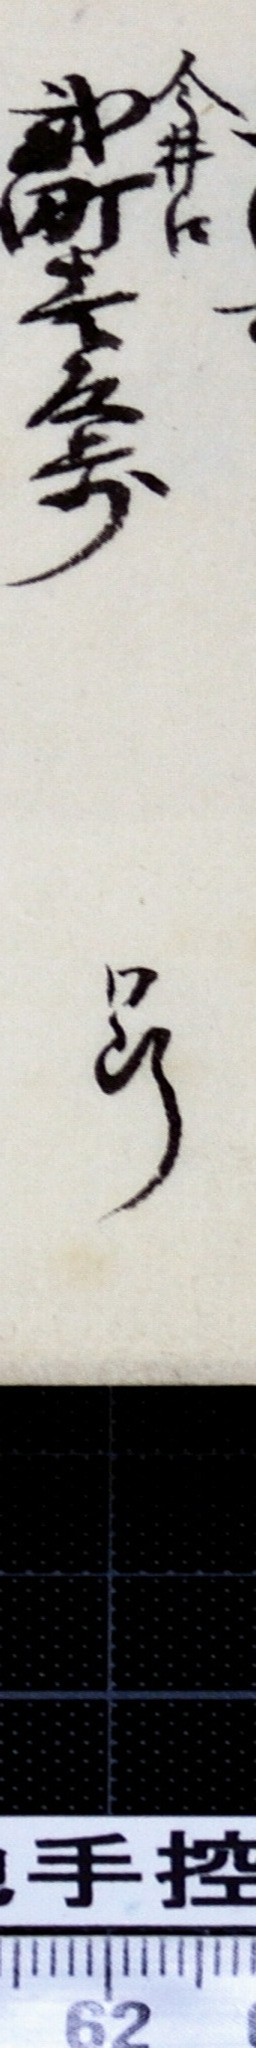弐町壱反歩同断
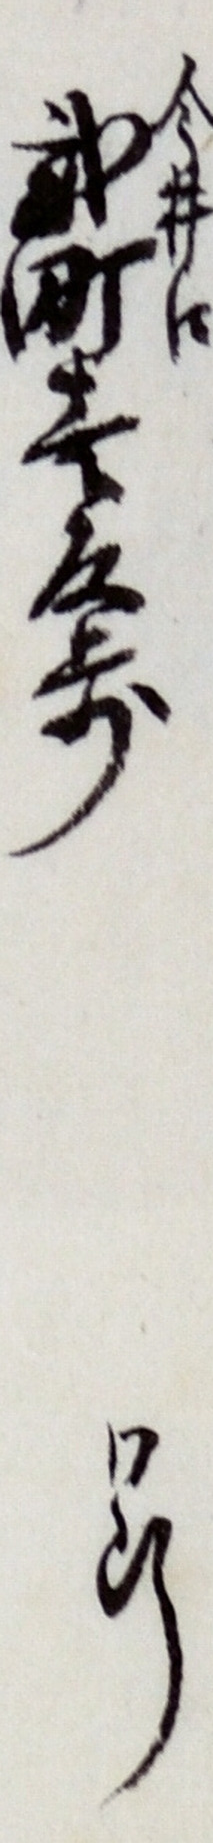弐町壱反歩同断
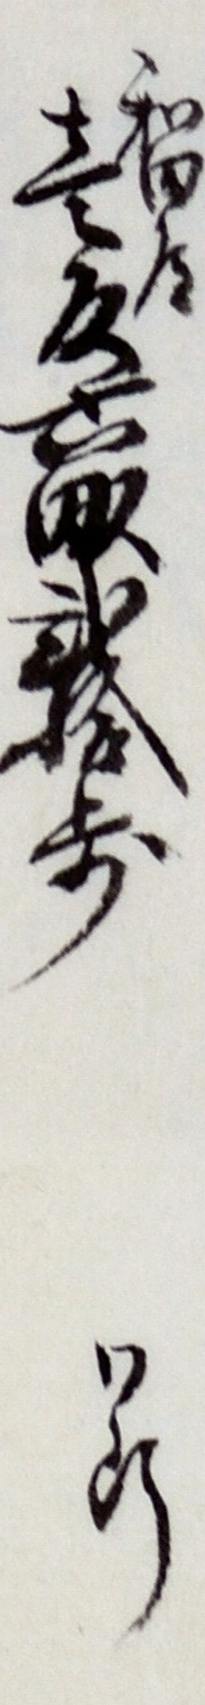壱反六畝弐拾歩同断
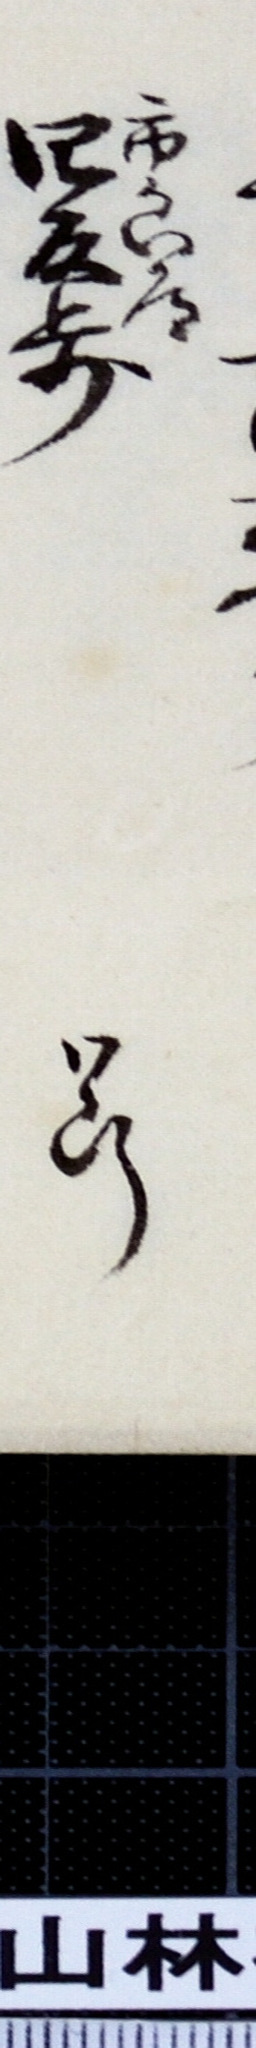四反歩同断
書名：御領分中山林社地手控
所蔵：伊那市立高遠町図書館・合同会社AMANE
